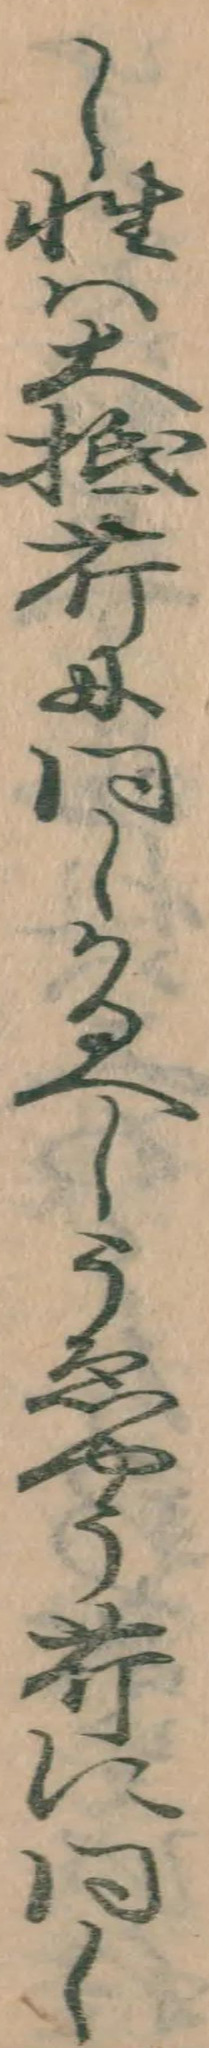し性は大抵芹に同しかるへしうゑやう芹におな同し
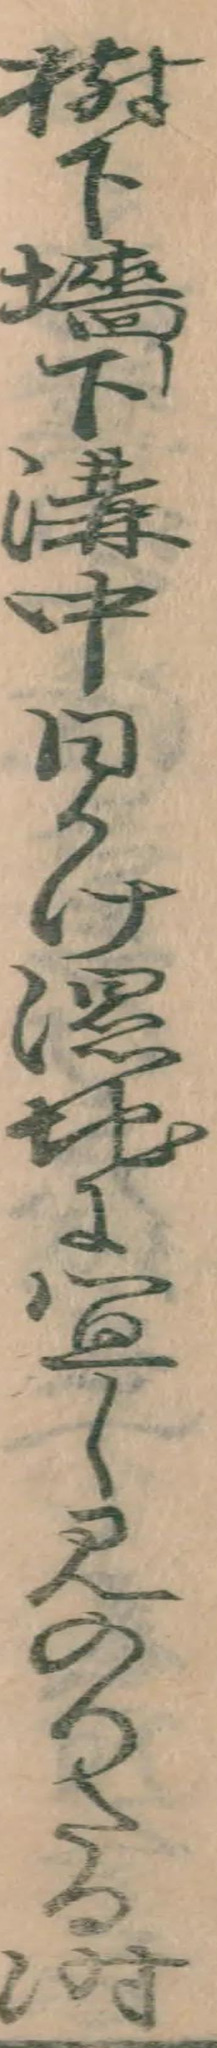樹下墻－-下溝中日かけ湿地に宜しみのりたる時
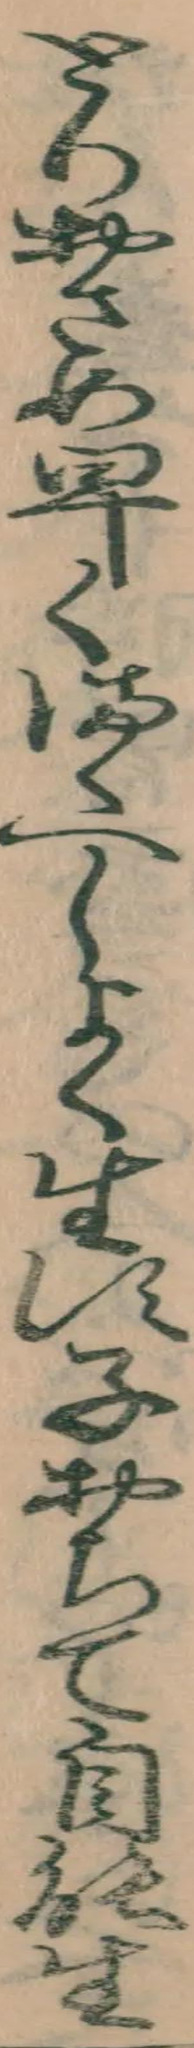とりおさめ早くまくへしよく生す子おちて自能生
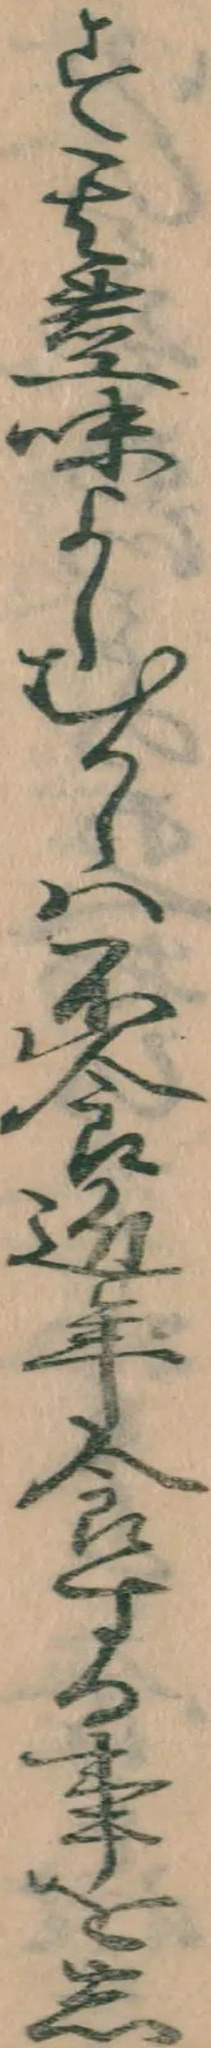す其茎味よしむかしは不食近年食する事をし
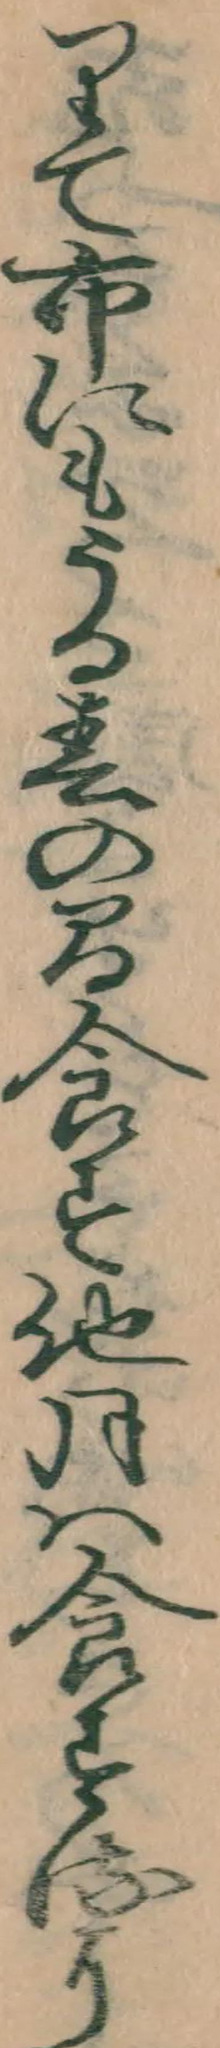りて市にもうる春の間食す他月は食するに
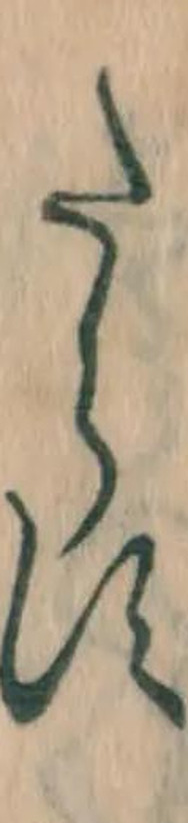たらす
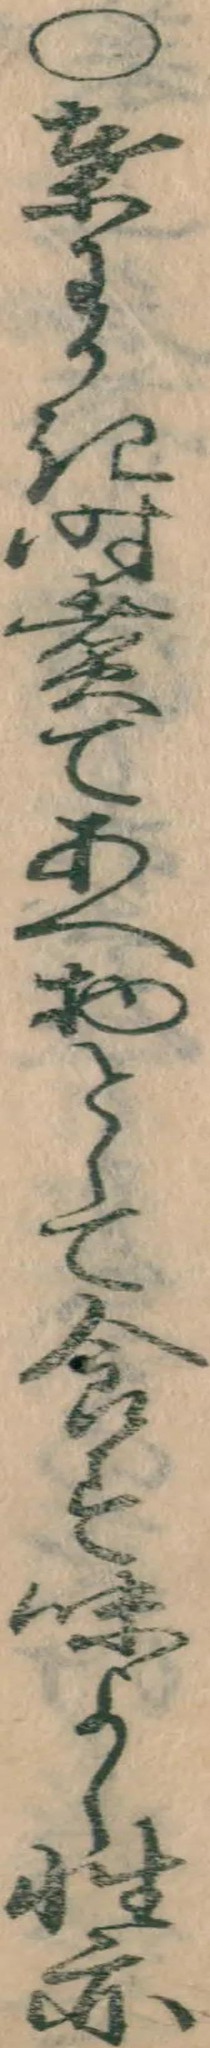〇葉わかき時煮てあへ物として食す味よし性亦
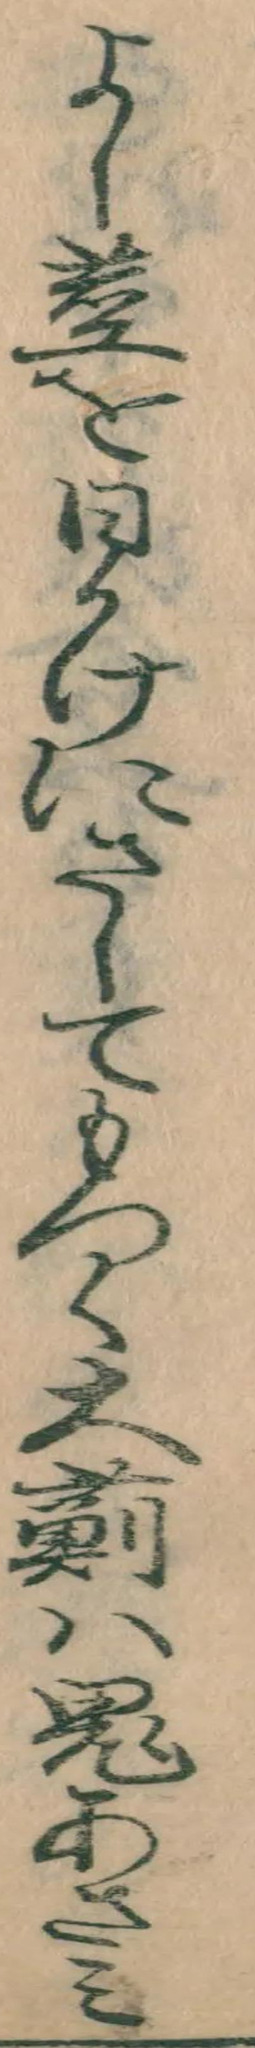よし茎を日かけにさしてもつく大薊は鬼あさみ
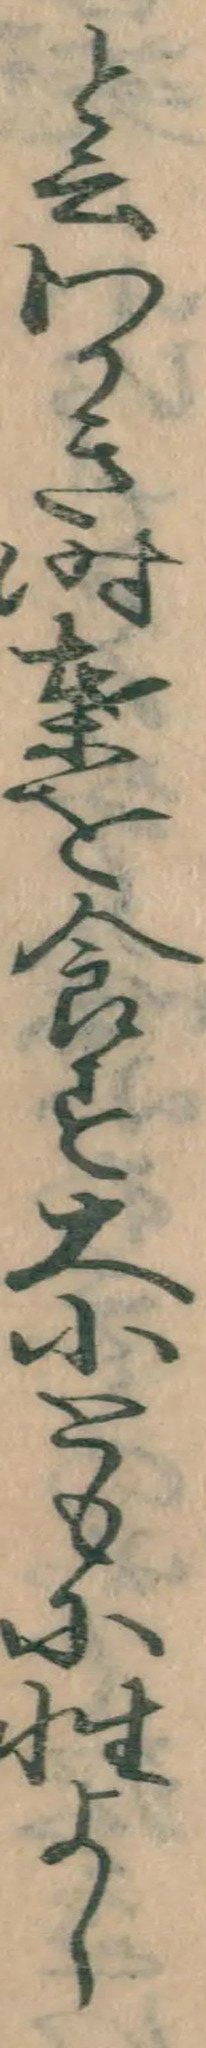と云わかき時葉を食す大小ともに性よし

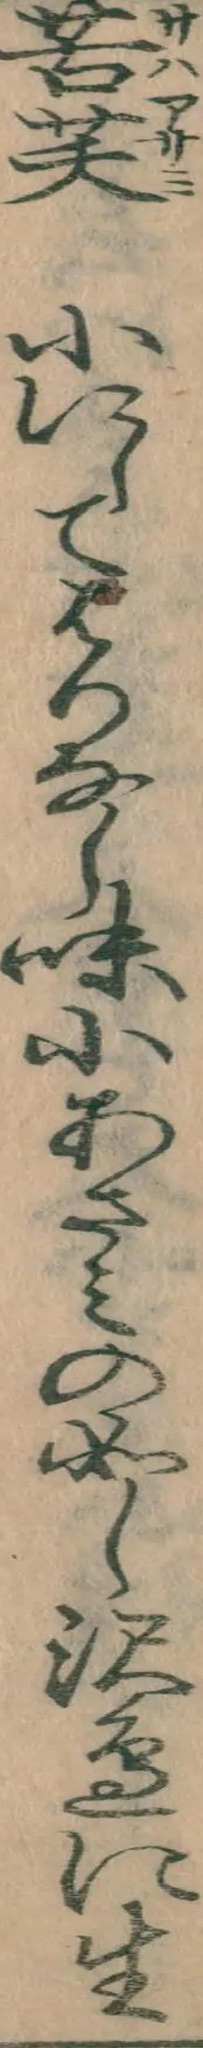苦芺小にしてはりなし味小あさみの如し沢辺に生
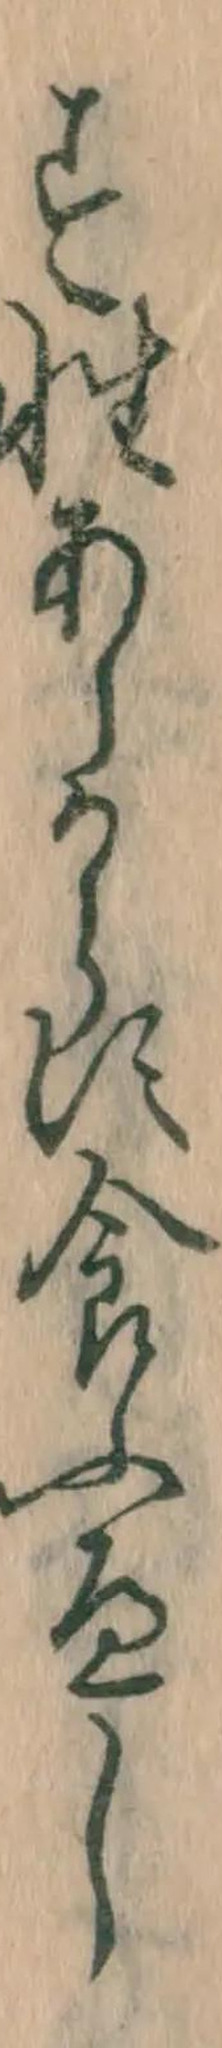す性あしからす食ふへし
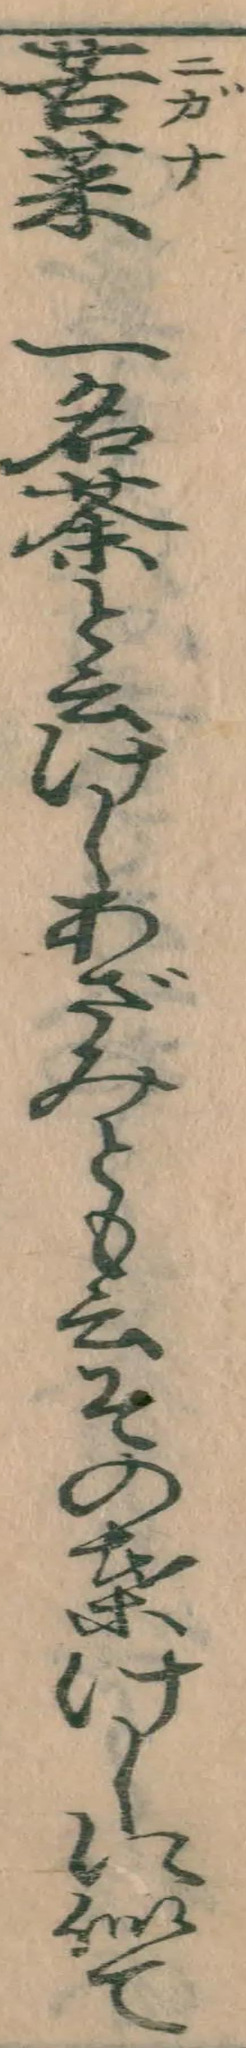苦菜一名茶と云けしあざみとも云その葉けしに似て
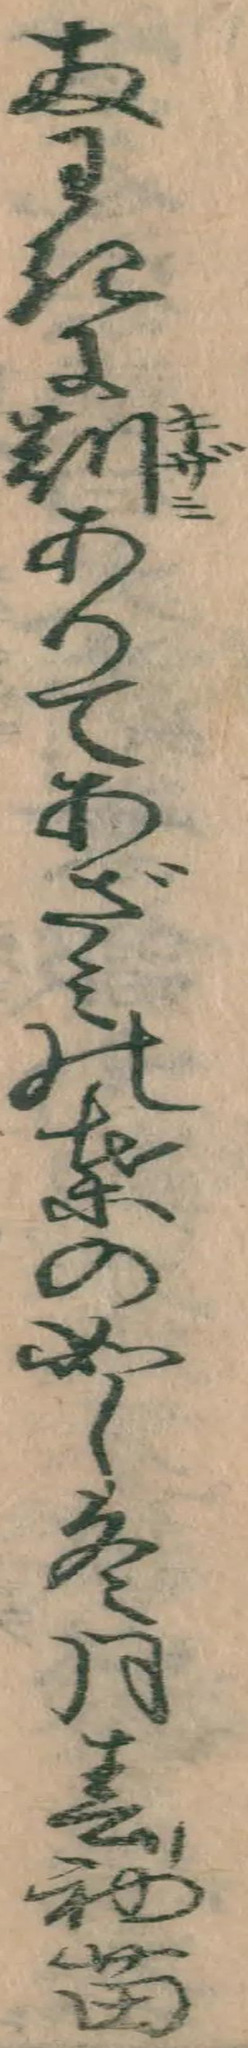両わきに刻ありてあざみの葉の如し冬月春-初苗
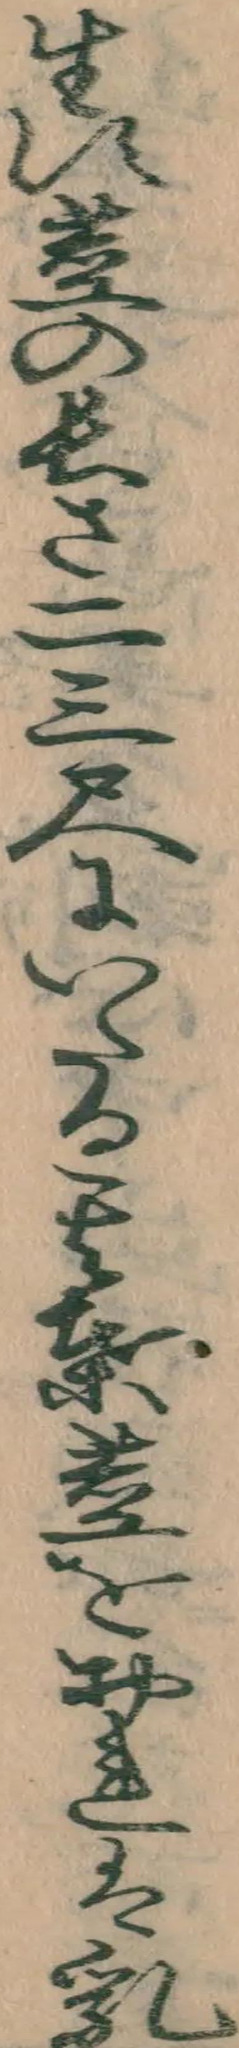生す茎の長さ二三尺にいたる其葉茎をおれは乳
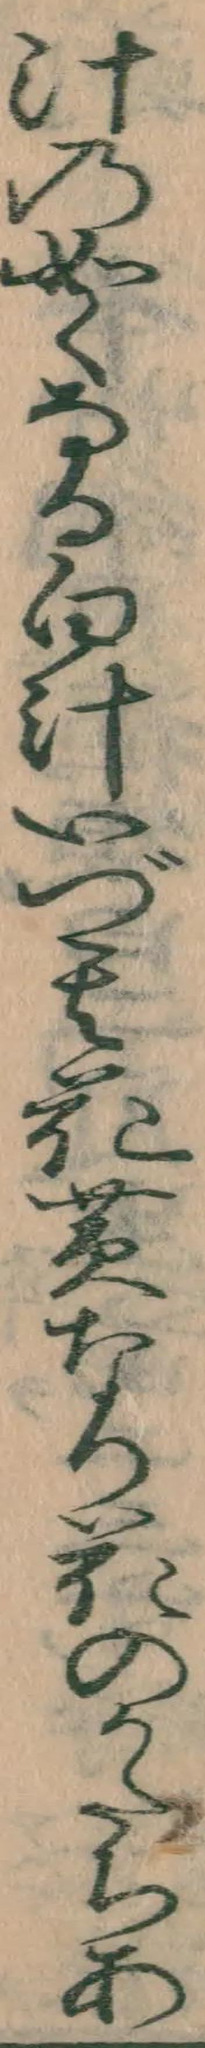汁の如くなる白汁いづ其花黄なり花のかたちあ
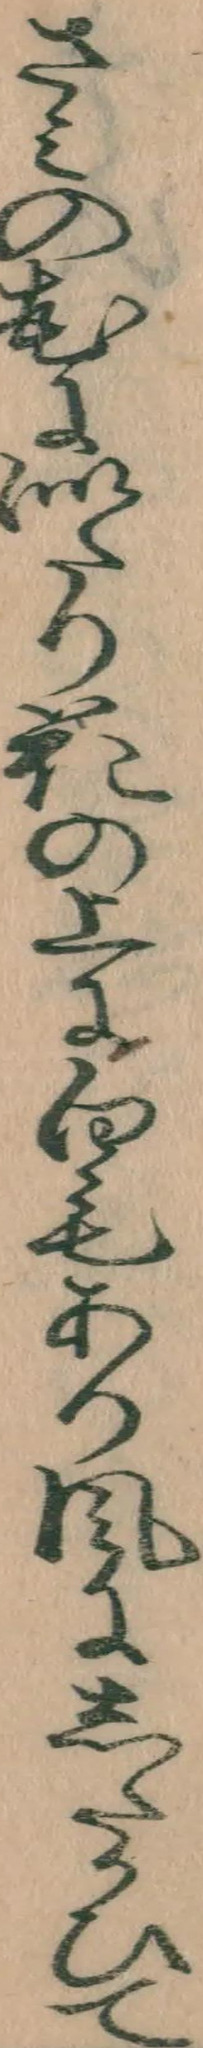さみの花に似たり花の上に白毛あり風にしたかひて
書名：菜譜 3巻
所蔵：国立国会図書館 National Diet Library, JAPAN
